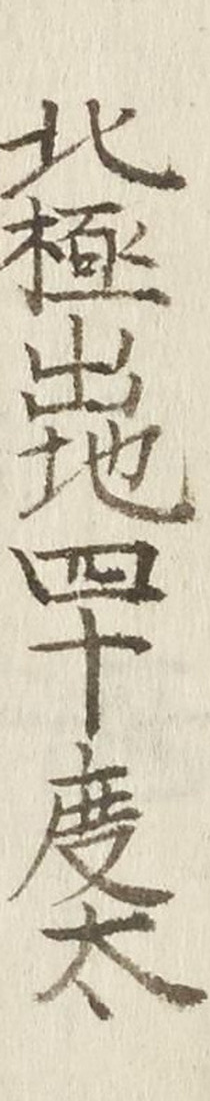北極出地四十度太
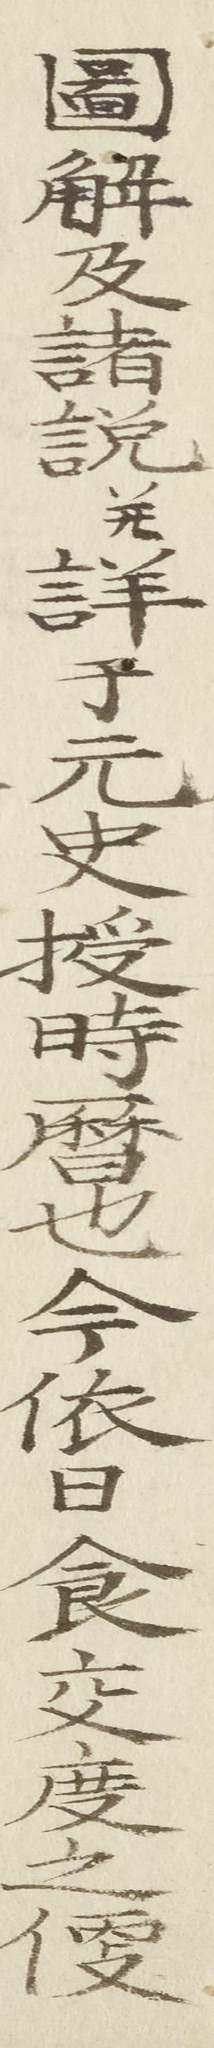図解及諸説并詳于元史授時暦也今依日食交度之便
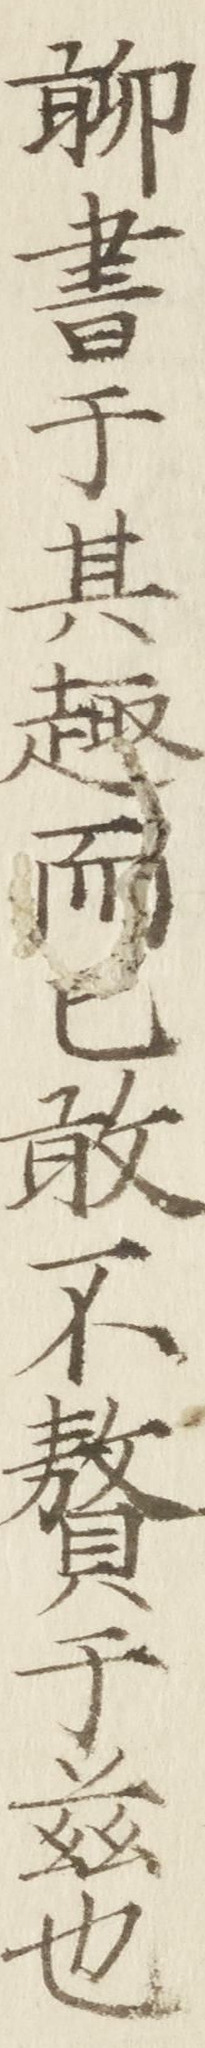聊書于其趣而已敢不贅于亨茲也

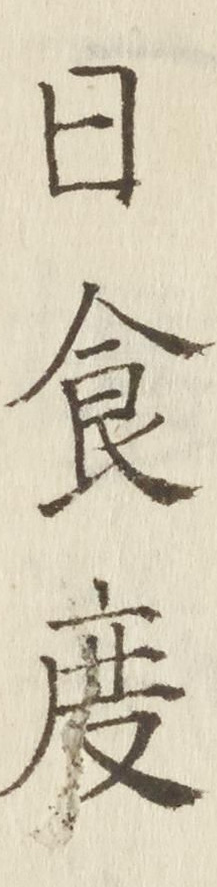日食度
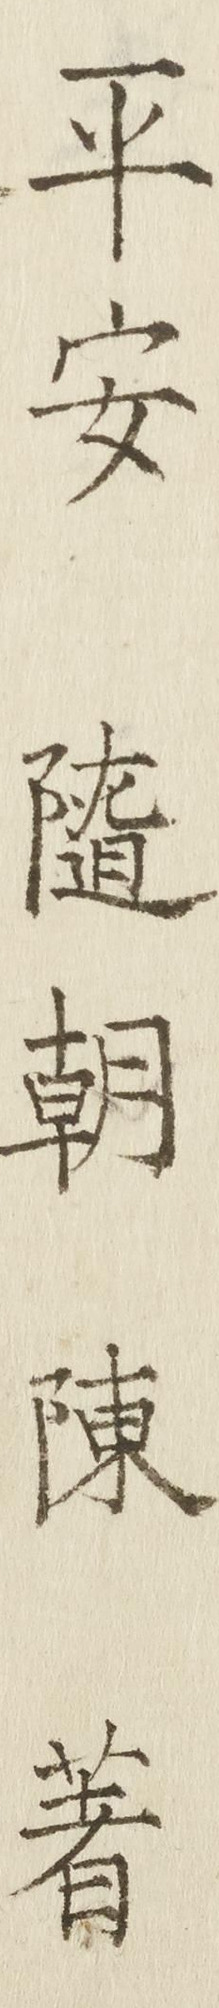平安随朝陳著
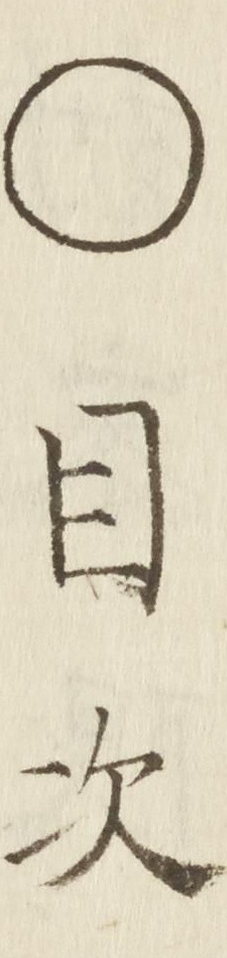○目次
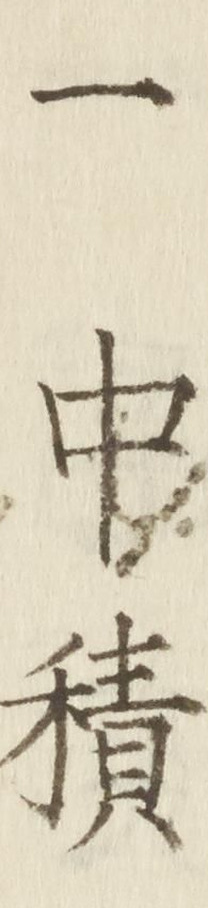一中積
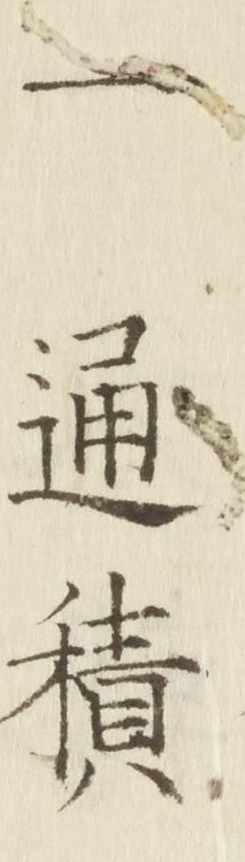一通積
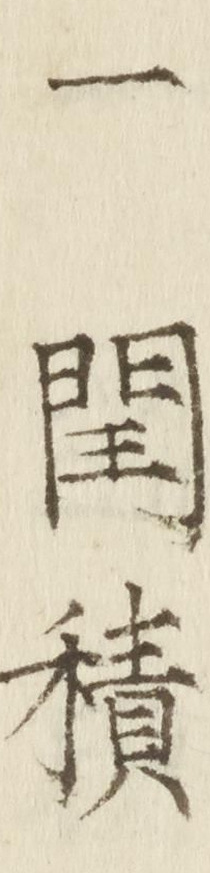一中積
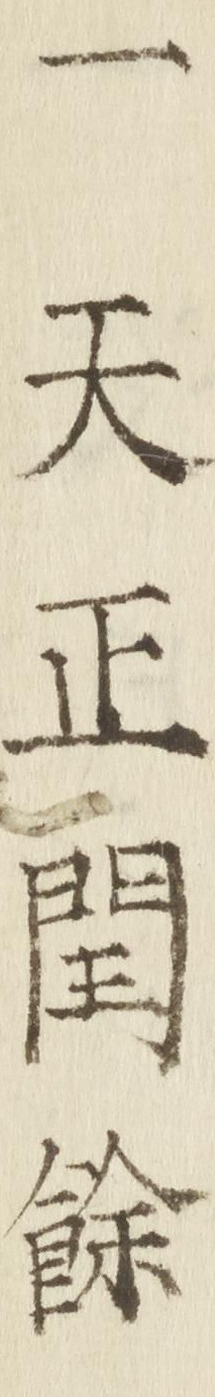一天正閏余

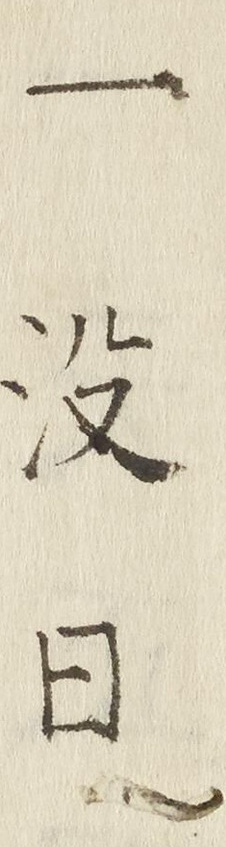一没日
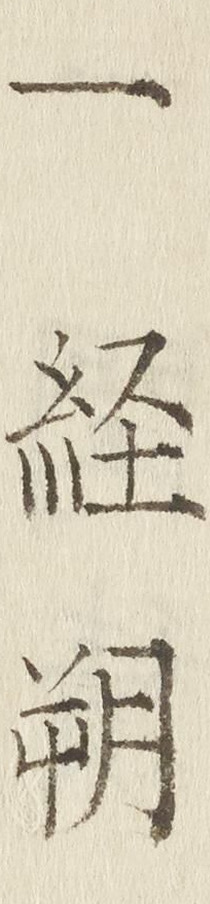一経朔
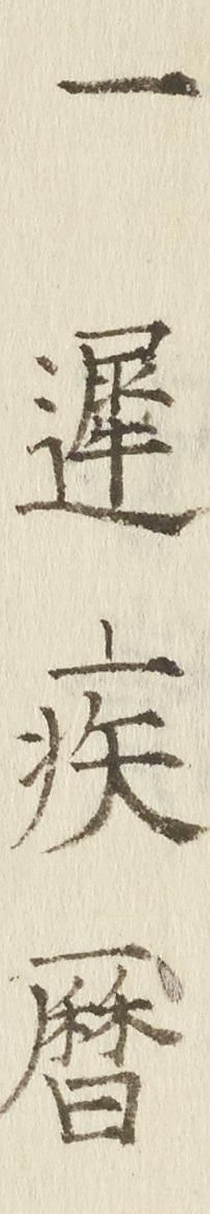一遅疾暦
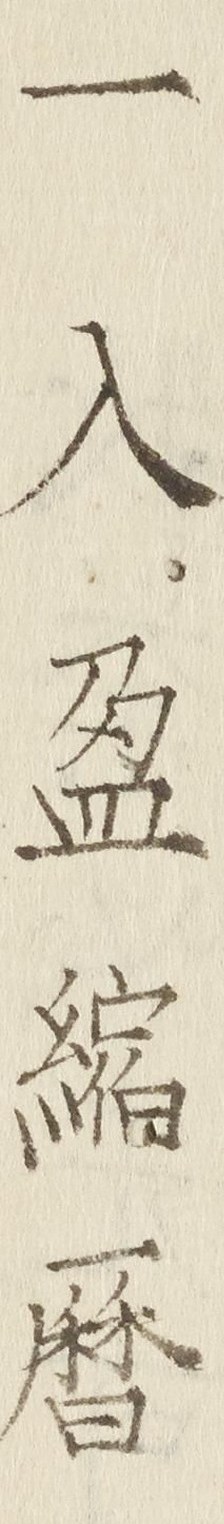一入盈縮暦
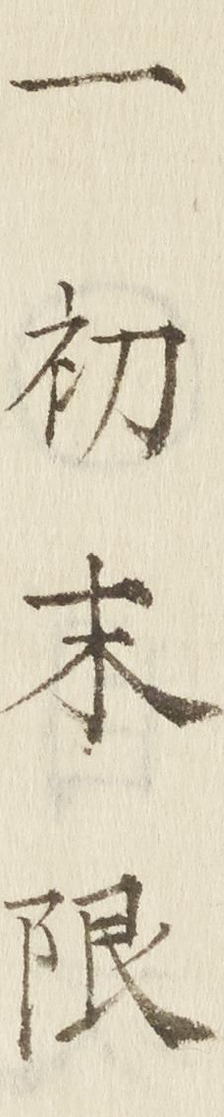一初末限
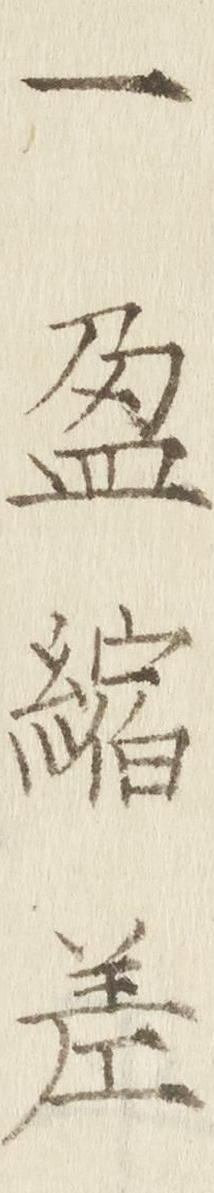一盈縮差
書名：日食度
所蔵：東京大学地震研究所図書室 Earthquake Research Institute Library, The University of Tokyo, JAPAN
